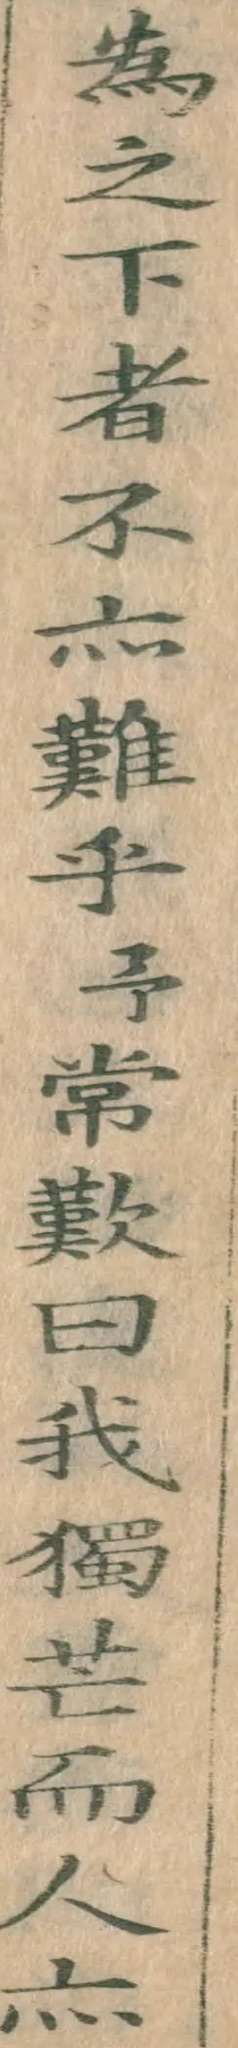為之下者不亦難乎予常歎曰我独芒而人亦
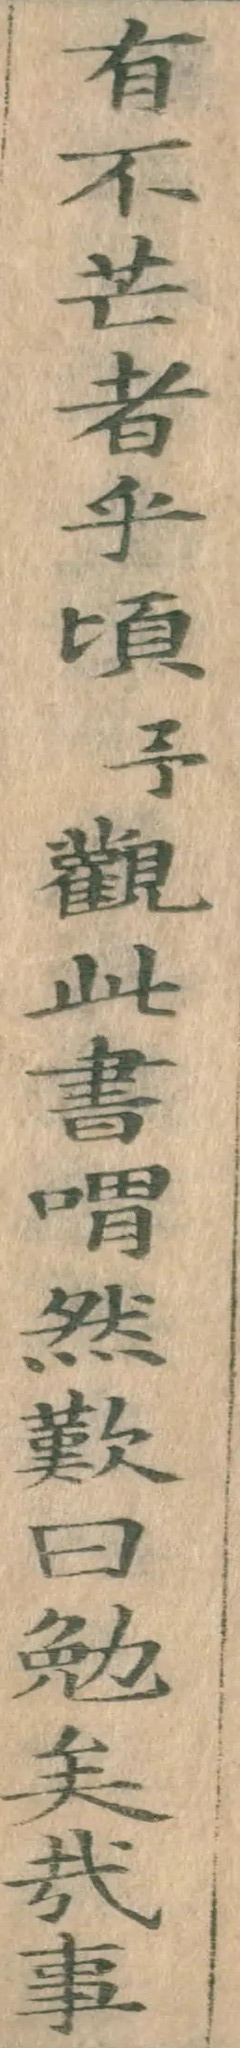有不芒者乎頃予観此書喟然歎曰勉矣哉事
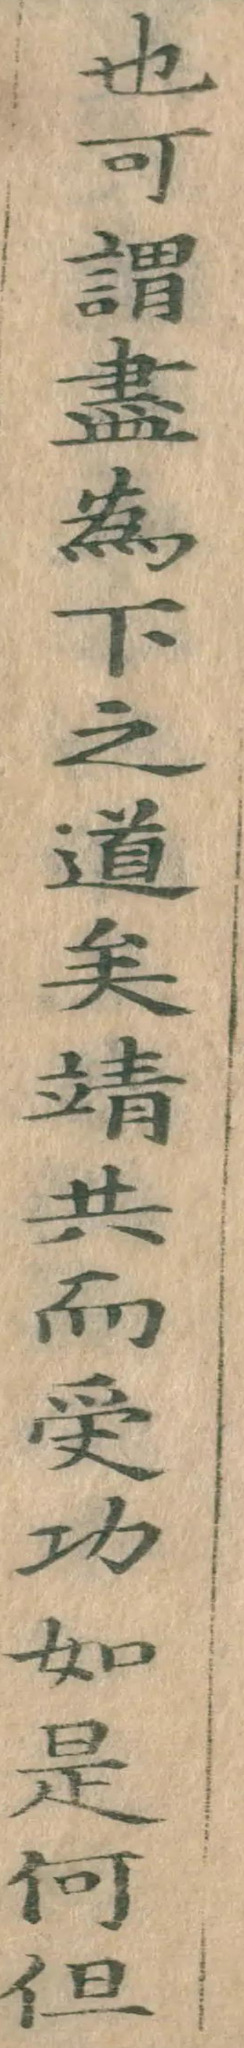也可謂尽為下之道矣靖共而受功如是何但
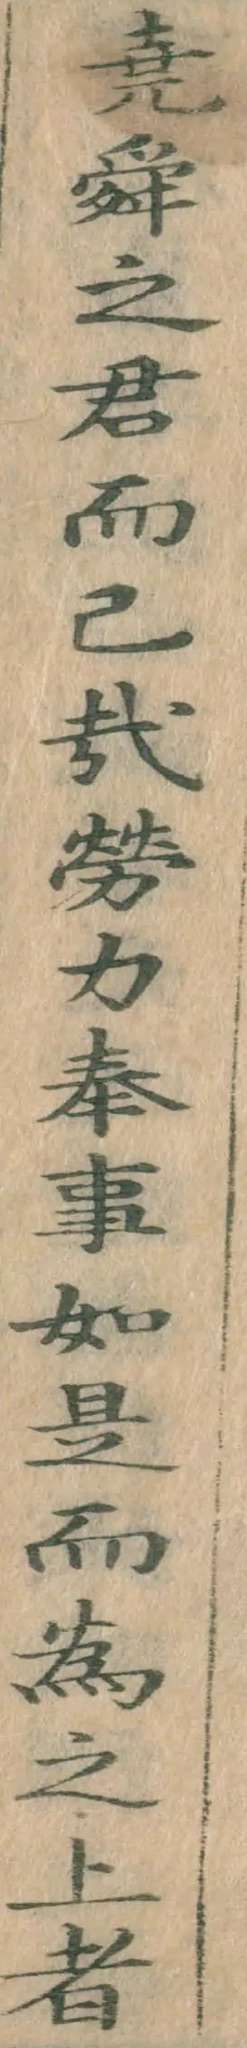堯舜之君而已哉労力奉事如是而為之上者

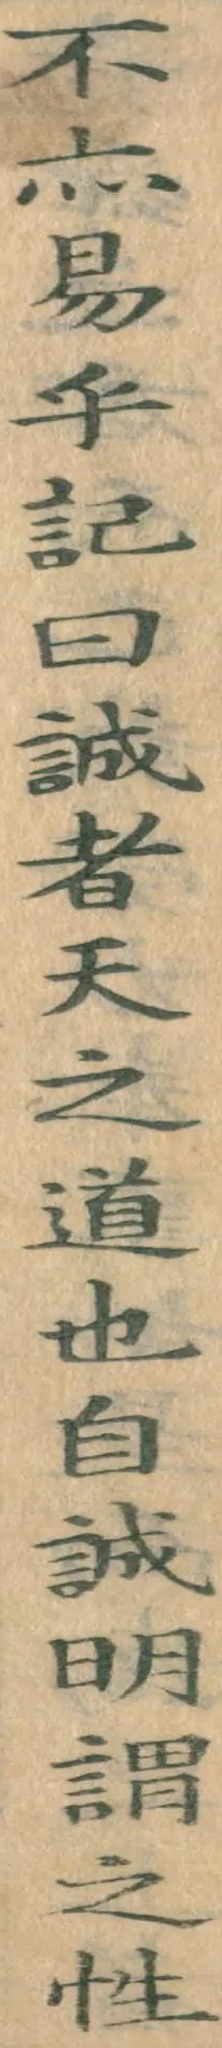不亦易乎記曰誠者天之道也自誠明謂之性
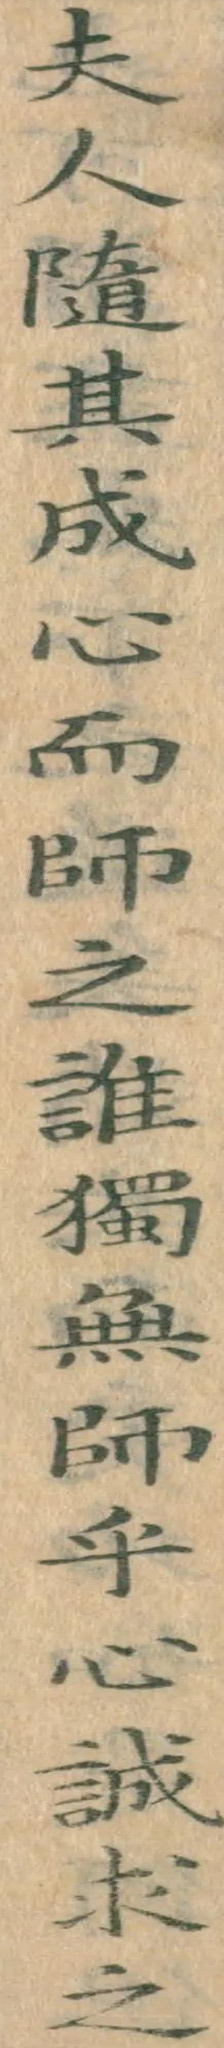夫人随其成心而師之誰独無師乎心誠求之
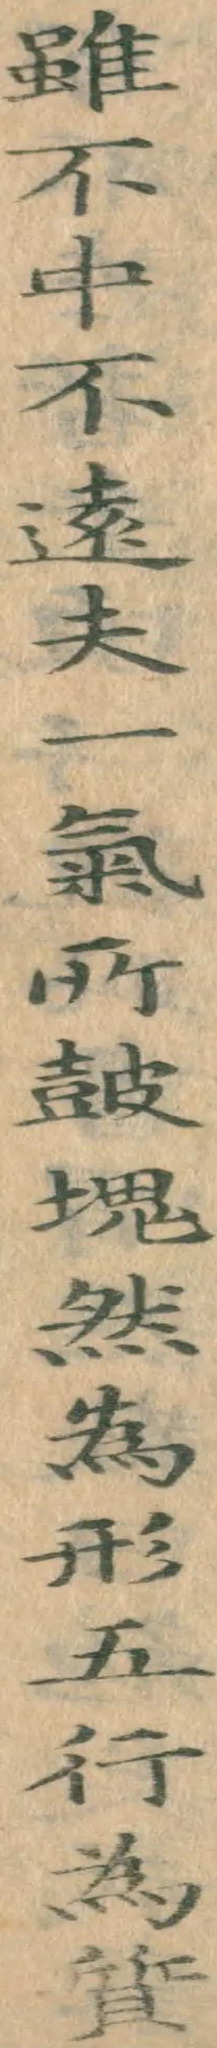雖不中不遠夫一気所皷塊然為形五行為質
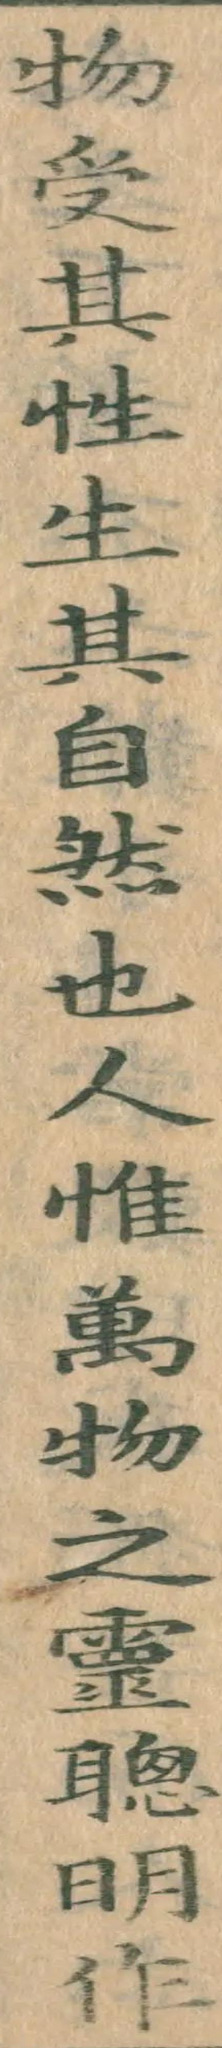物受其性生其自然也人惟万物之霊聴明作
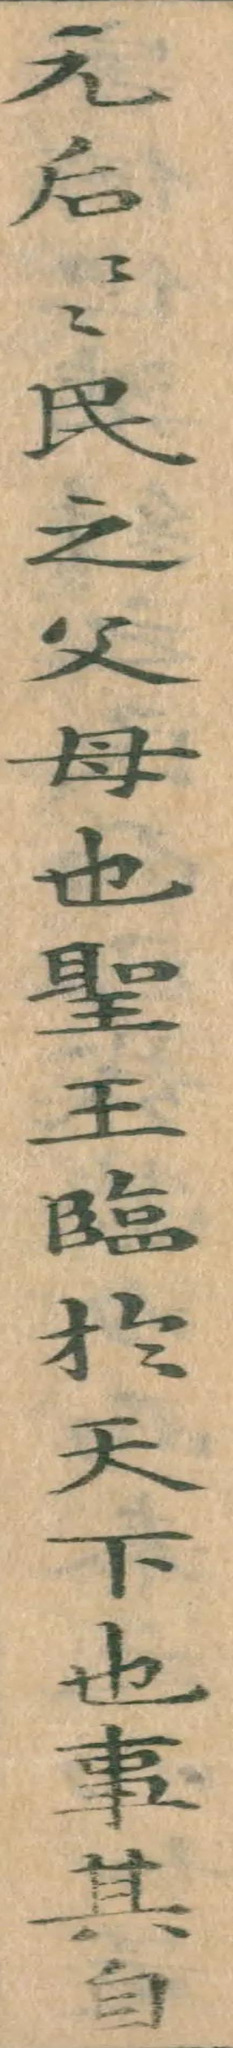元后々々民之父母也聖王臨於天下也事其自
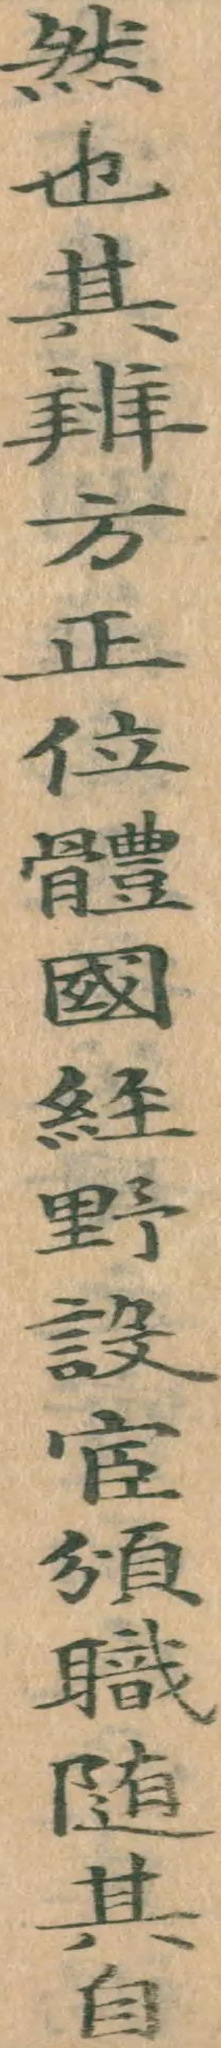然也其弁方正位体国経野設宦頌職随其自
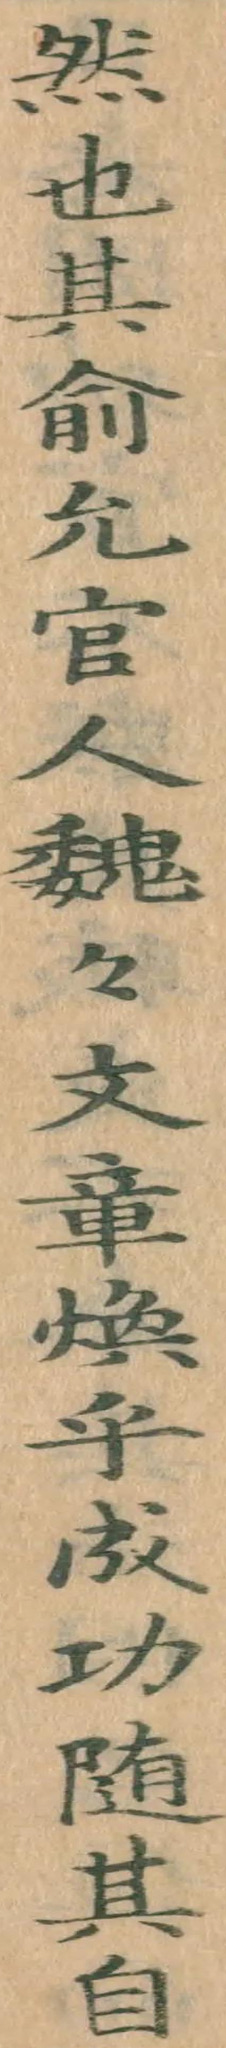然也其兪允官人魏々文章煥乎成功随其自
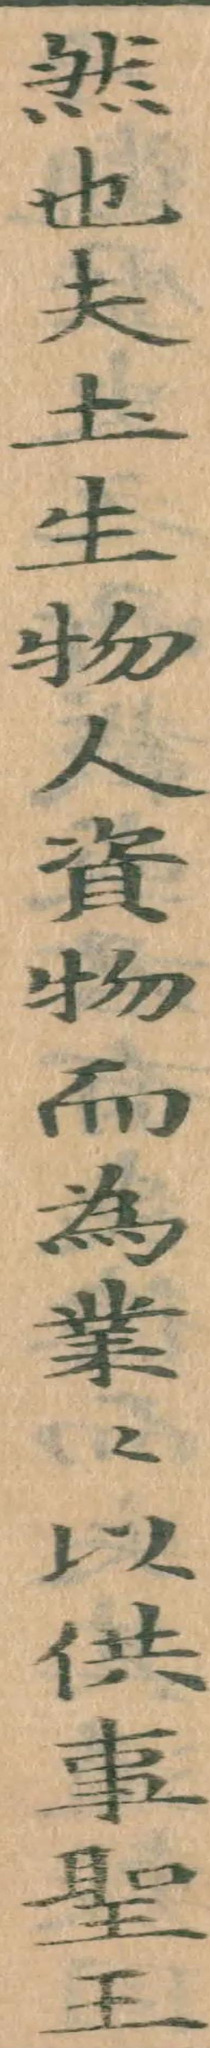然也夫土生物人資物而為業々以供事聖王
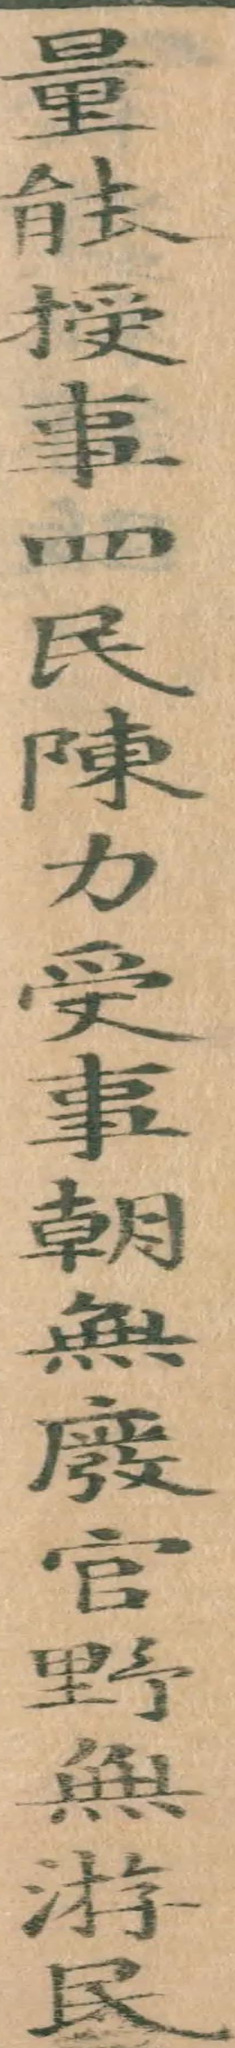量能授事四民陳力受事朝無廃官野無游民
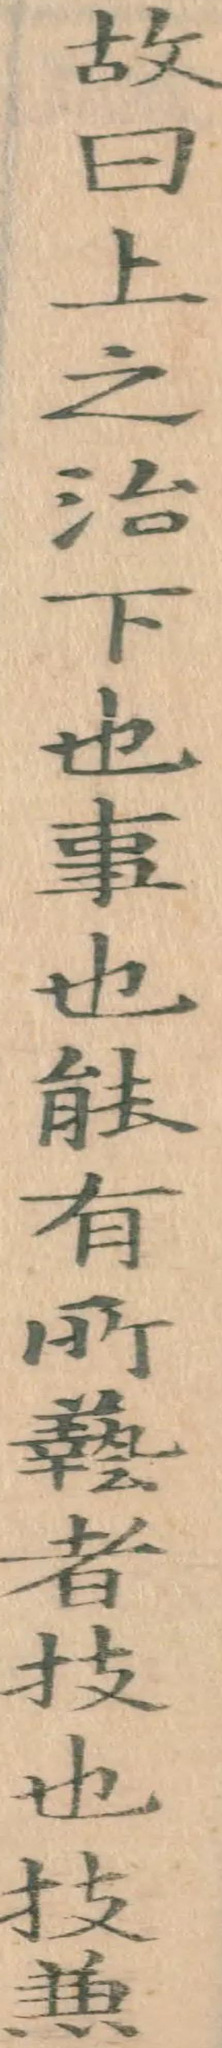故曰上之治下也事也能有所芸者技也技兼
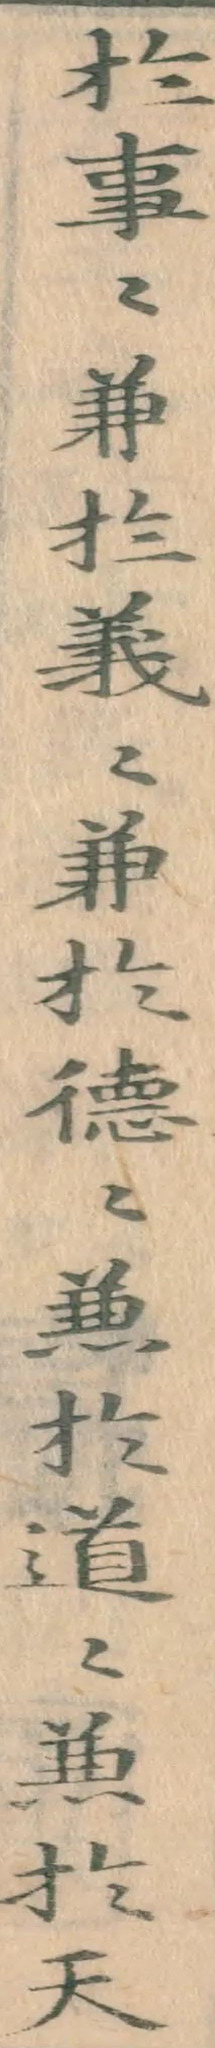被事々兼被義々兼被徳々兼被道々兼被天
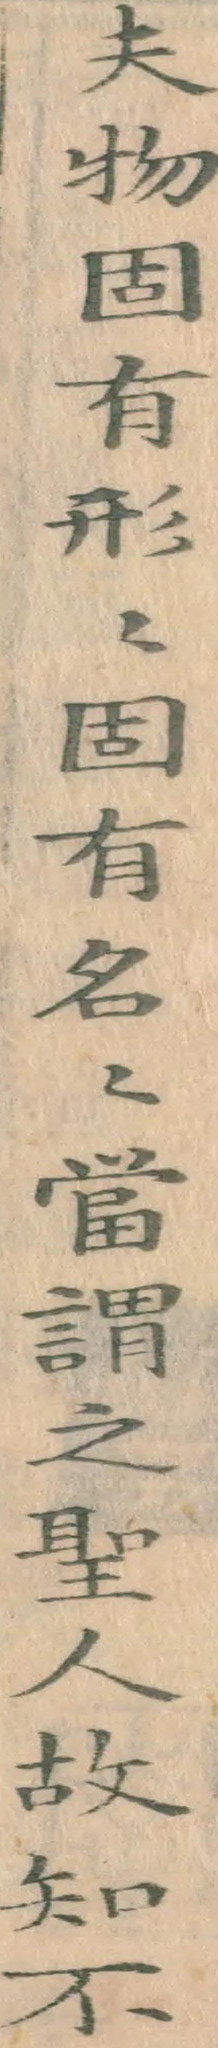夫物固有形々固有名々当謂之聖人故知不
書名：養蚕秘録 3巻. [3]
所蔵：国立国会図書館 National Diet Library, JAPAN
